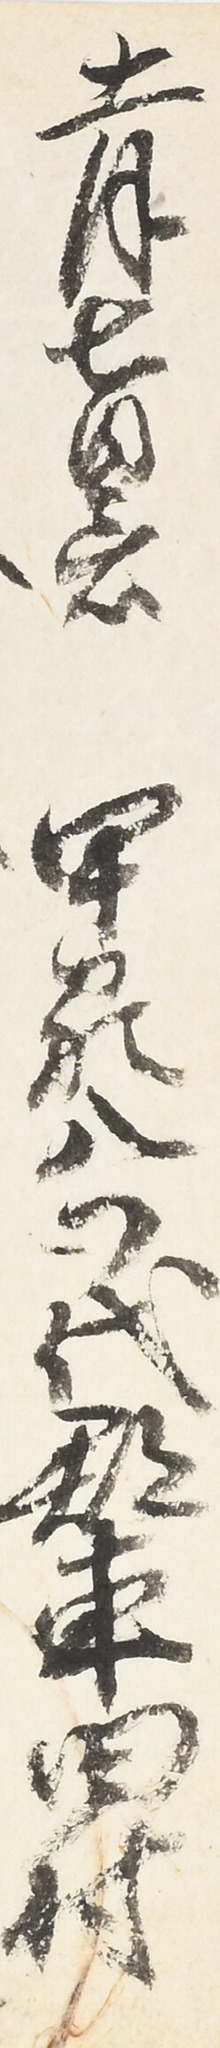十一月七日着甲州八ツ代郡車田村
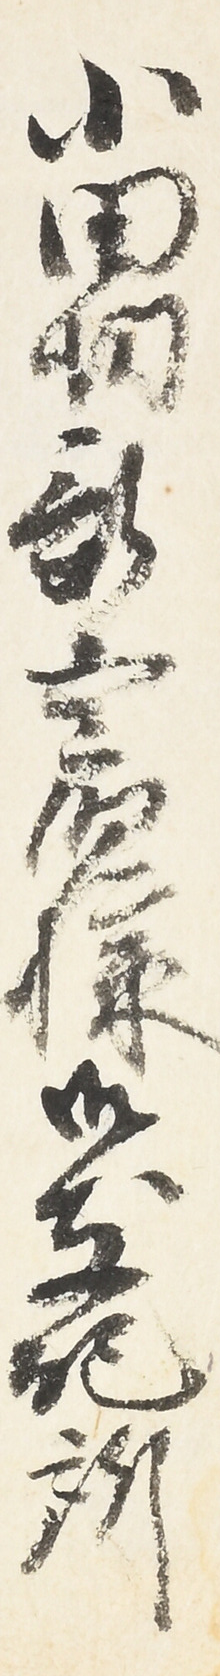小田切新五郎様御支配所
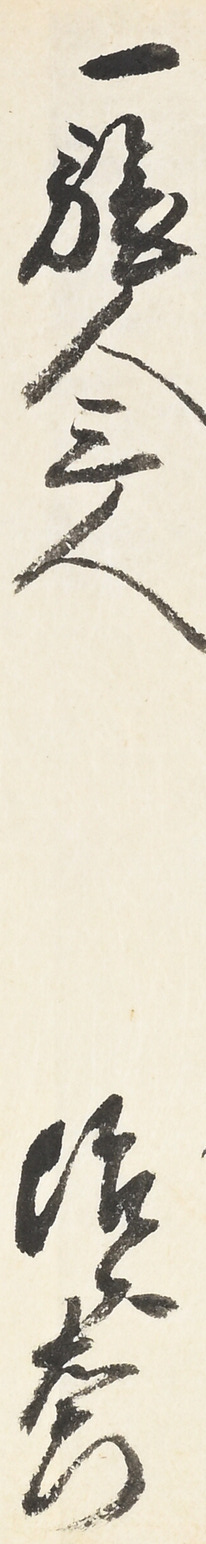一旅人三人治郎右衛門
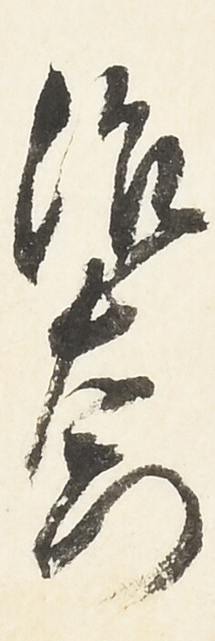治右衛門
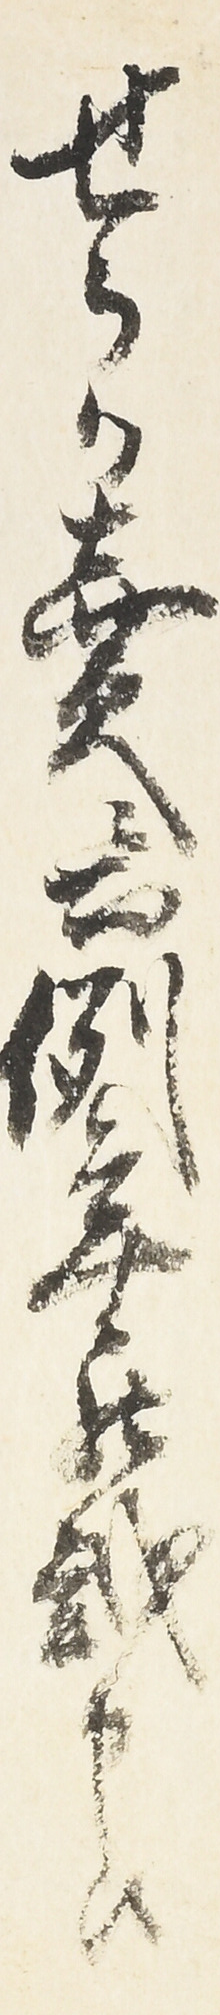せうか売ニ而例年罷越申候
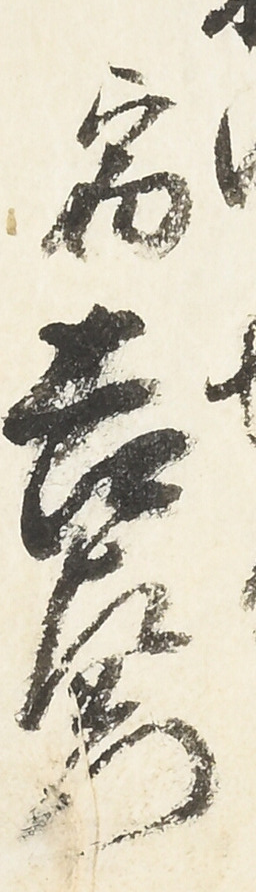宿吉左衛門
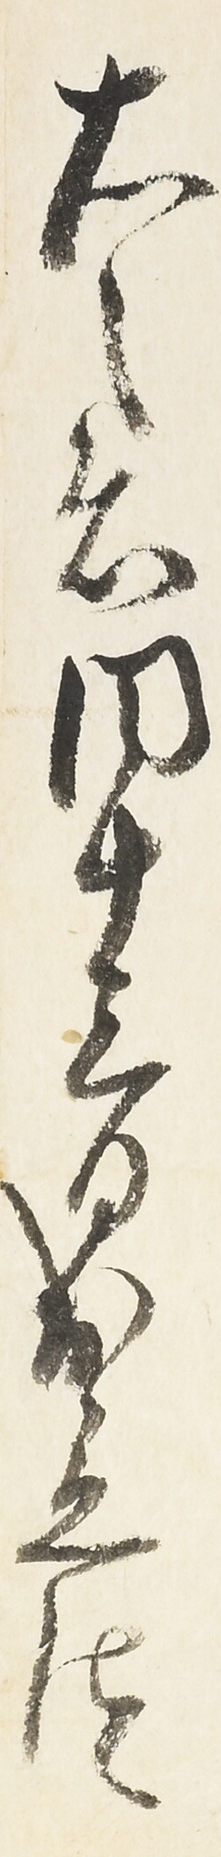右之者同十三日出立仕候
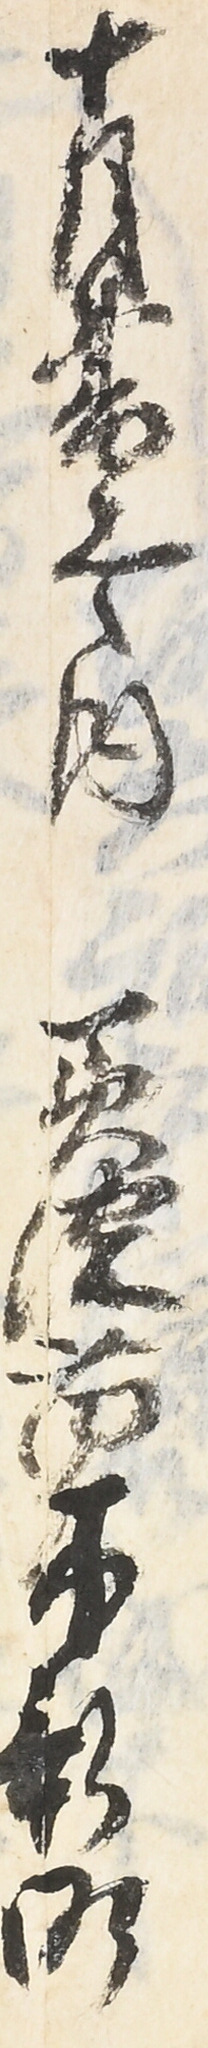十月書上之内美濃苗木新町
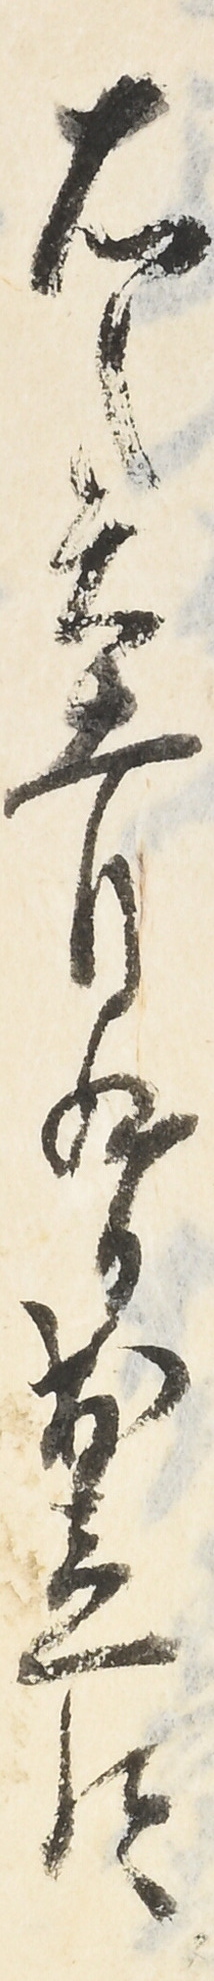右之者十一月九日出立仕候
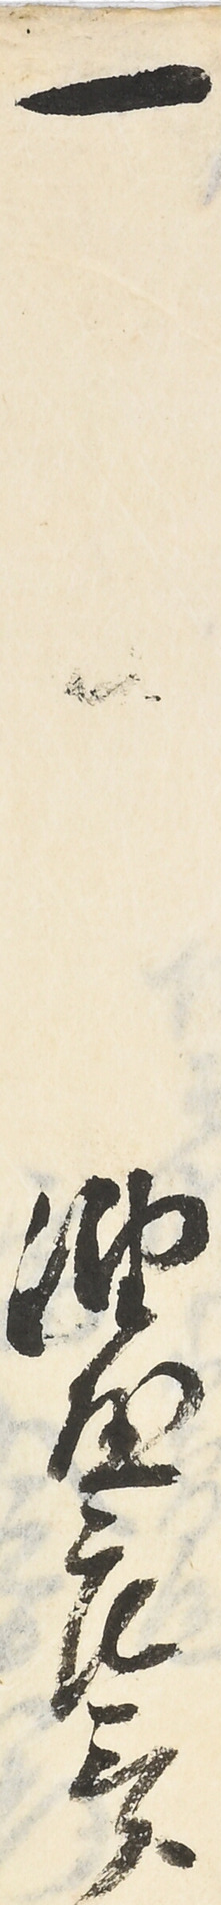一油屋庄三郎
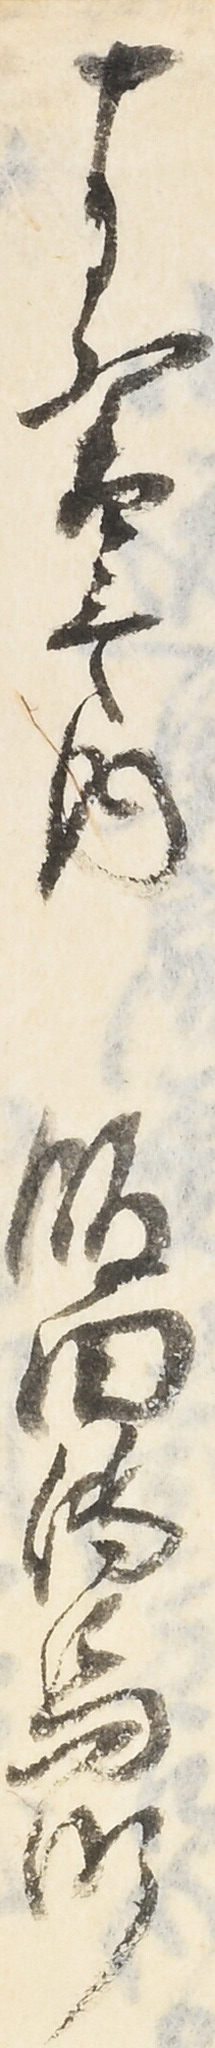十月書上之内飯田伝馬町
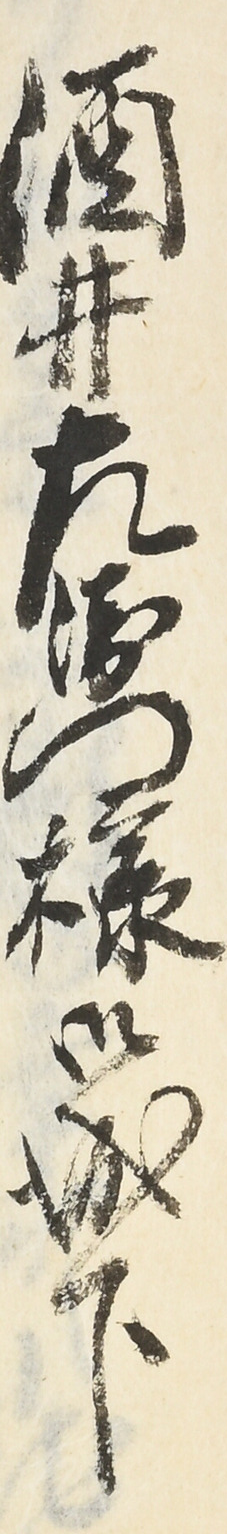酒井左衛門様御城下
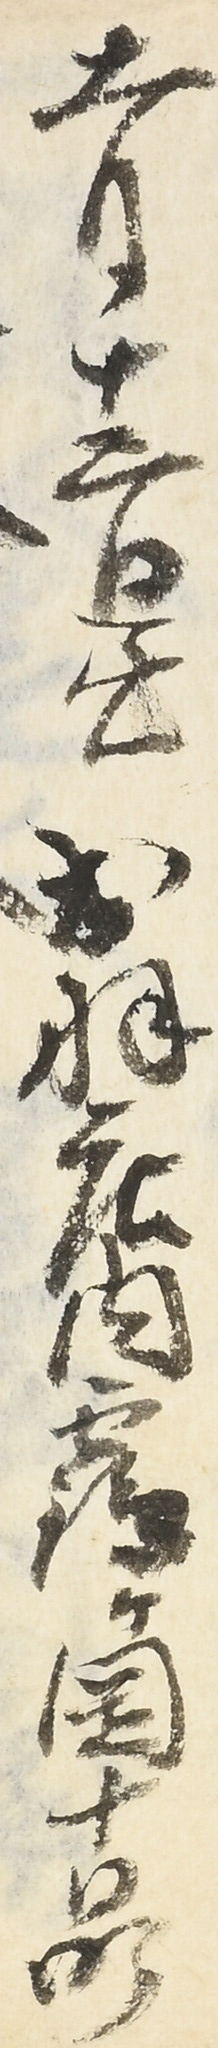十一月十三日着出羽庄内鶴ヶ国十日町
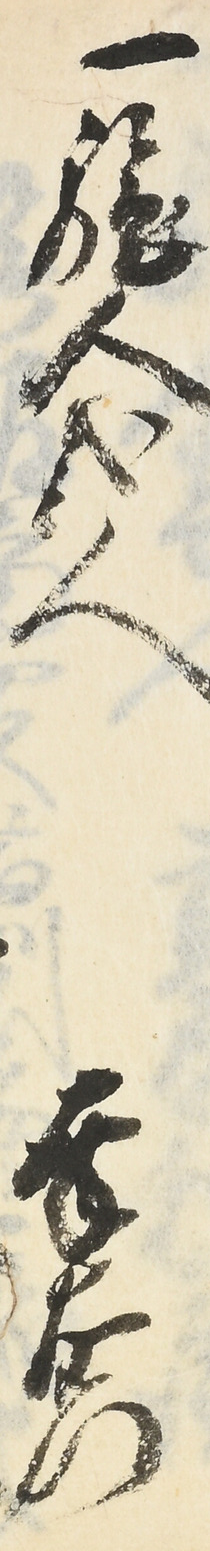一旅人弐人幸右衛門
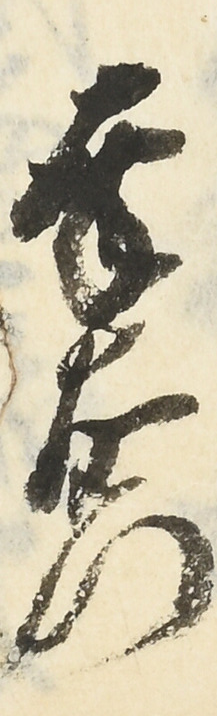治右衛門
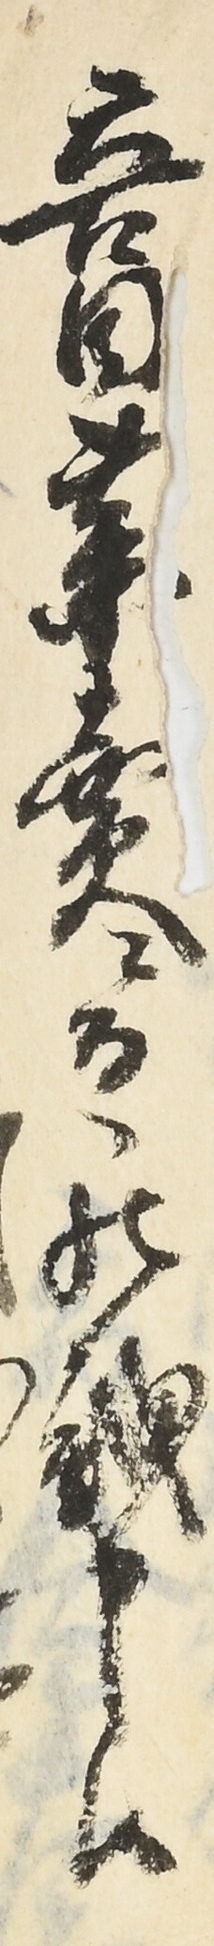膏薬売ニ而罷越申候
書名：町中旅人泊控帳
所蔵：伊那市立高遠町図書館・合同会社AMANE
